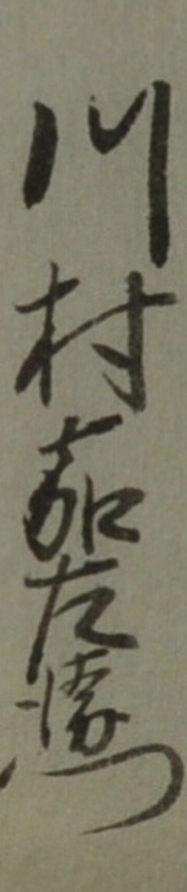川村嘉左衛門
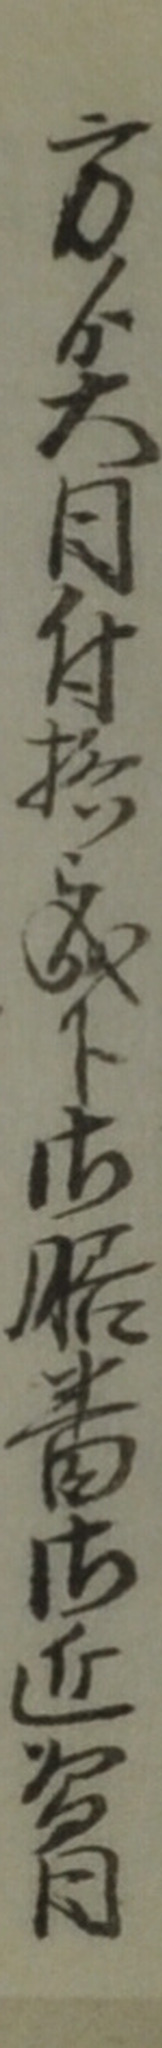方ゟ大目付格被成下御膳番御近習目
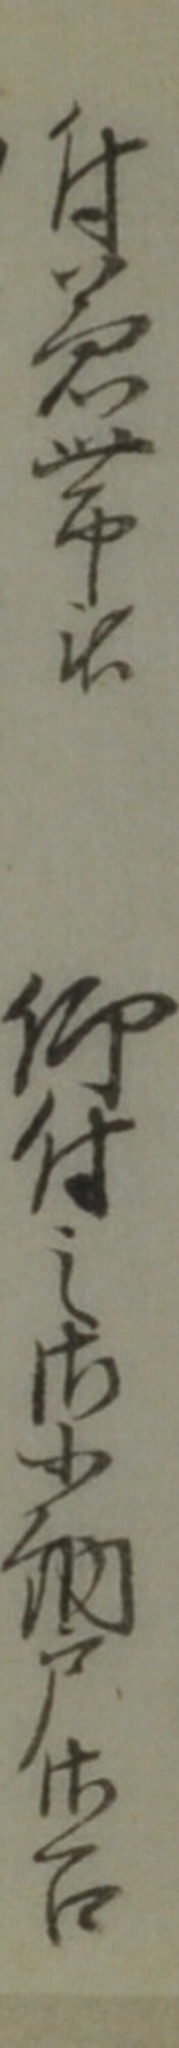付兼帯被仰付之御小納戸御召
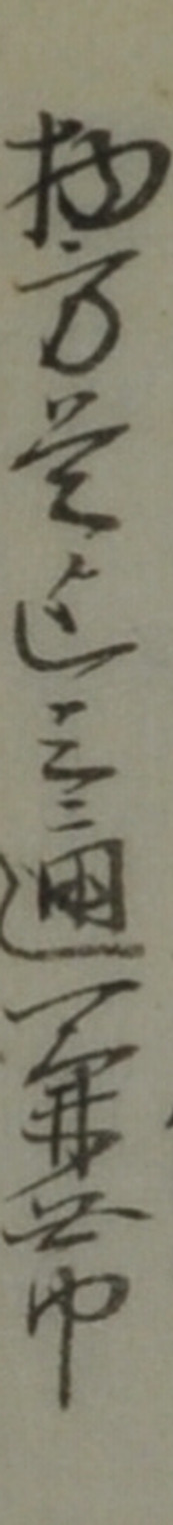物方是迄之通兼帯
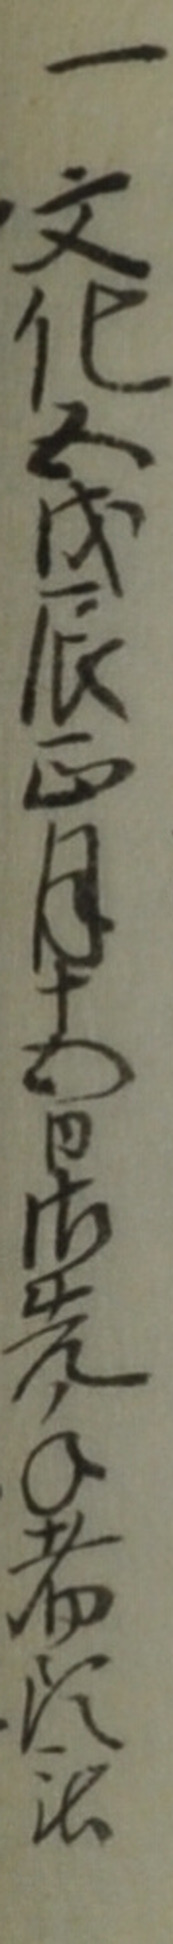一文化五戊辰正月十五日御先手者頭被
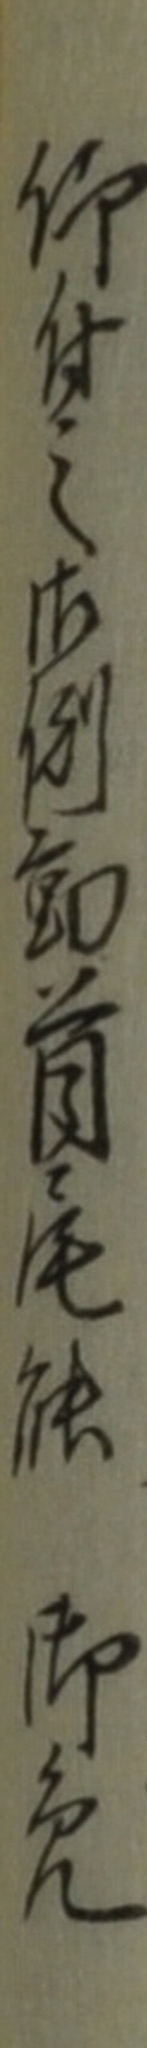仰付之御側勤首尾能御免
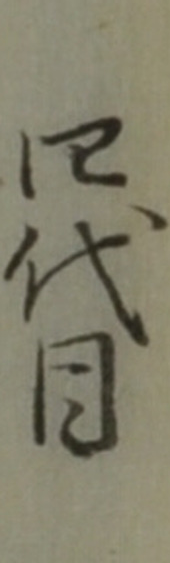四代目
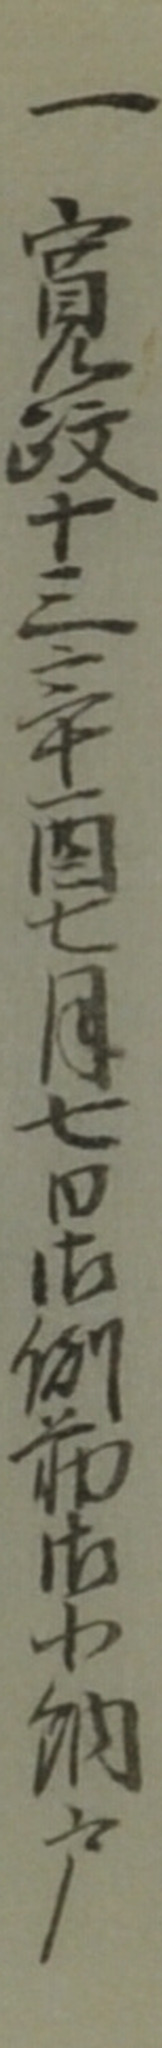一寛政十三辛酉七月七日御側勤方御小納戸
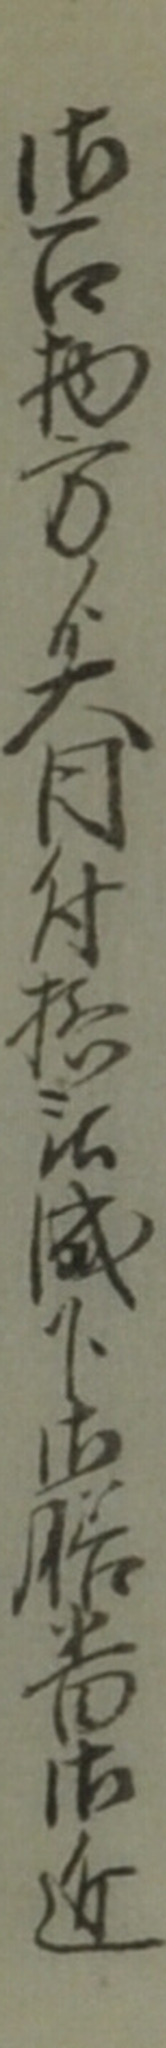御召物方ゟ大目付格被成下御膳番御近
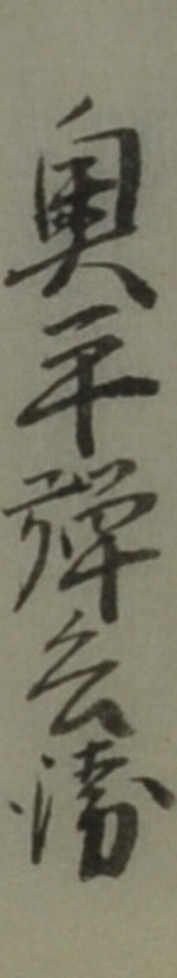奥平弾兵衛
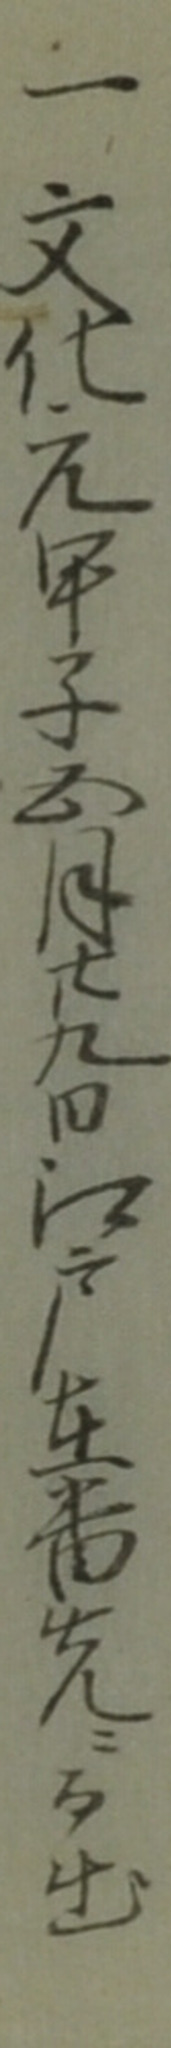一文化元甲子五月廿九日江戸在番先ニ而出
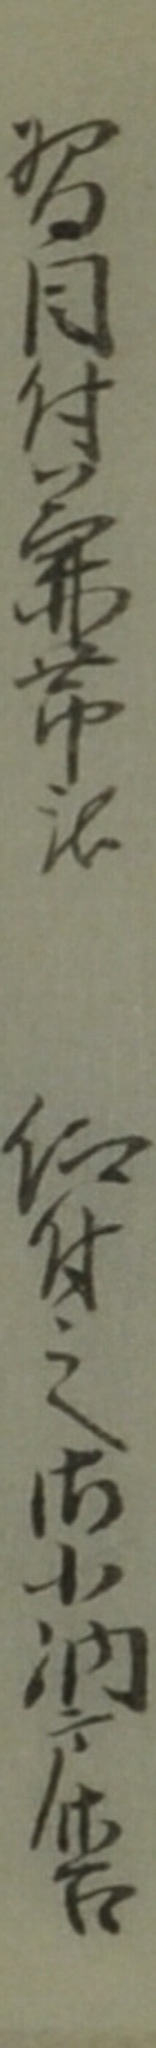習目付兼帯被仰付之御小納戸御召
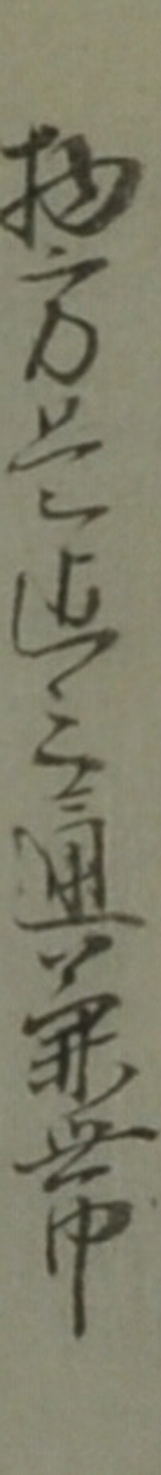物方是迄之通兼帯
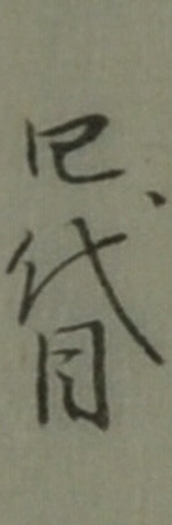四代目
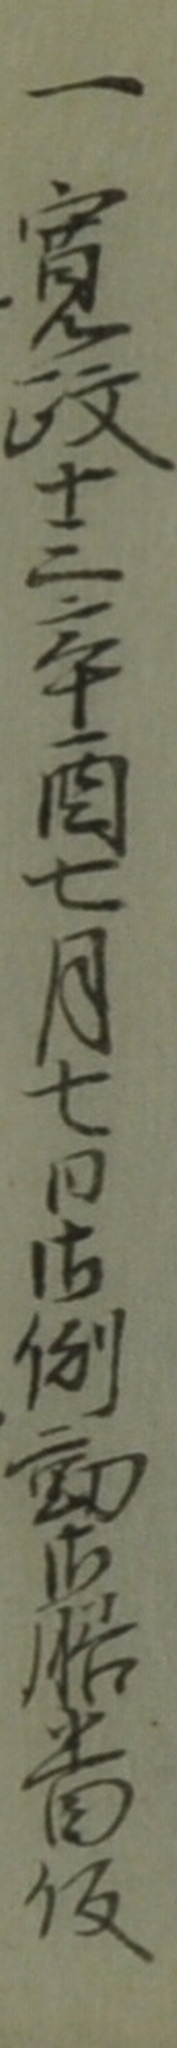一寛政十三辛酉七月七日御側勤御膳番仮
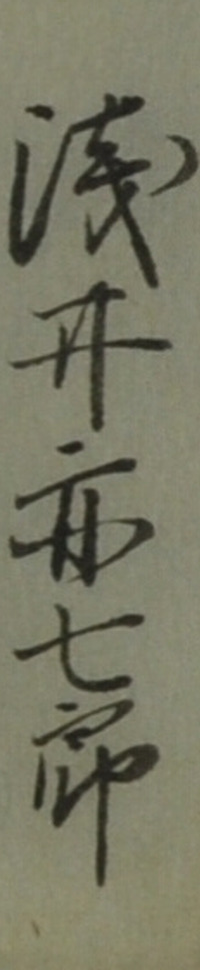浅井亦七郎
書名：諸御役代々録（四）
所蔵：伊那市立高遠町図書館・合同会社AMANE
